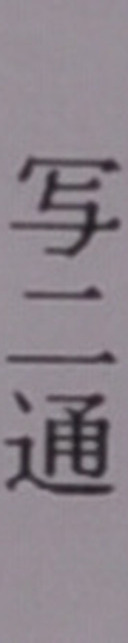写二通
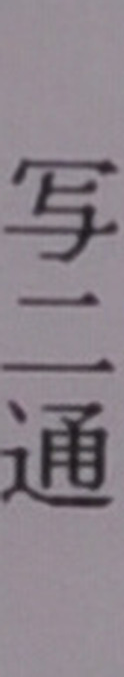写二通
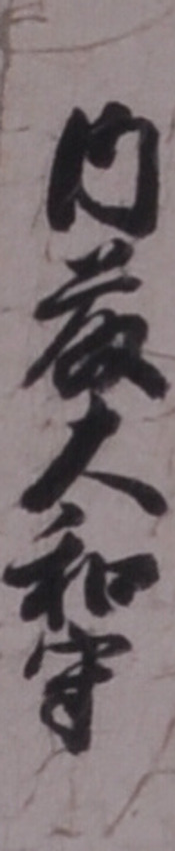内藤大和守
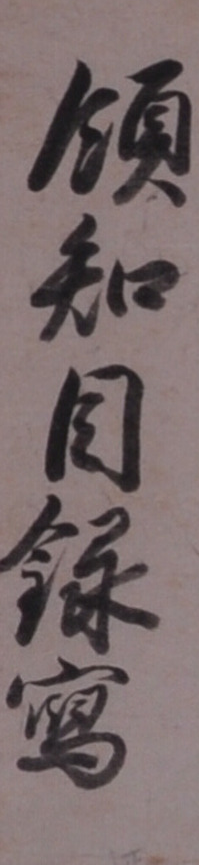領知目録写
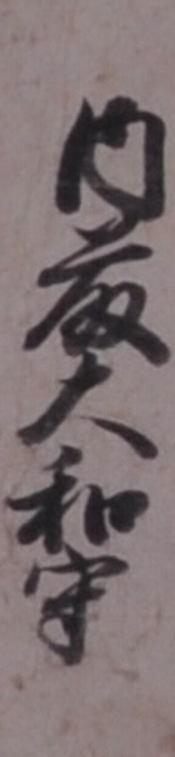内藤大和守

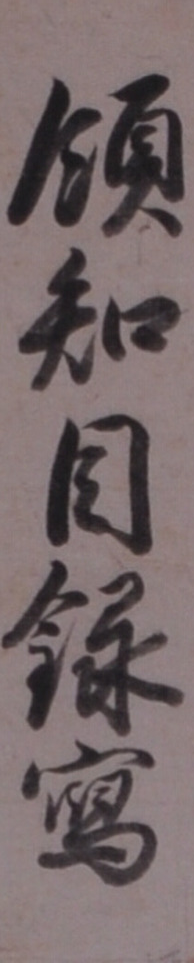領知目録写
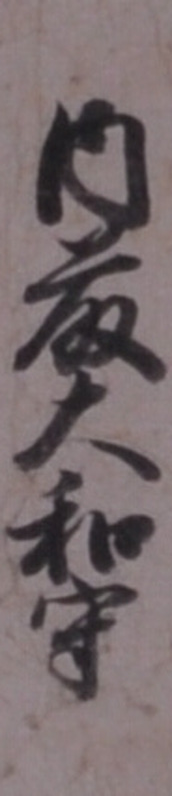内藤大和守

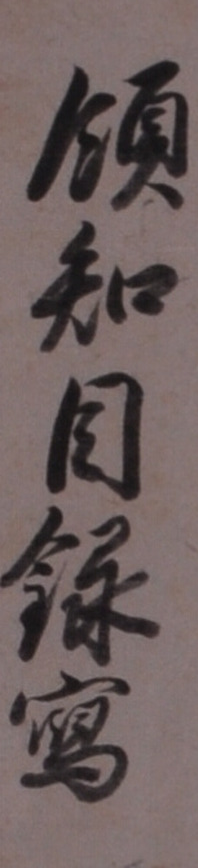領知目録写
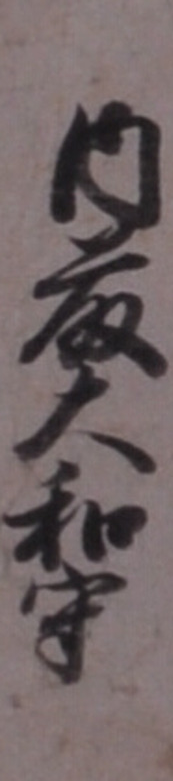内藤大和守

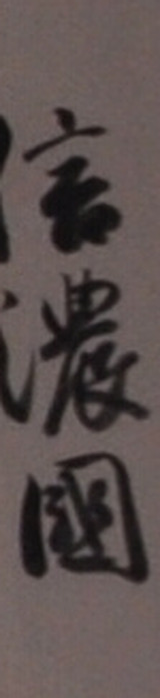信濃国
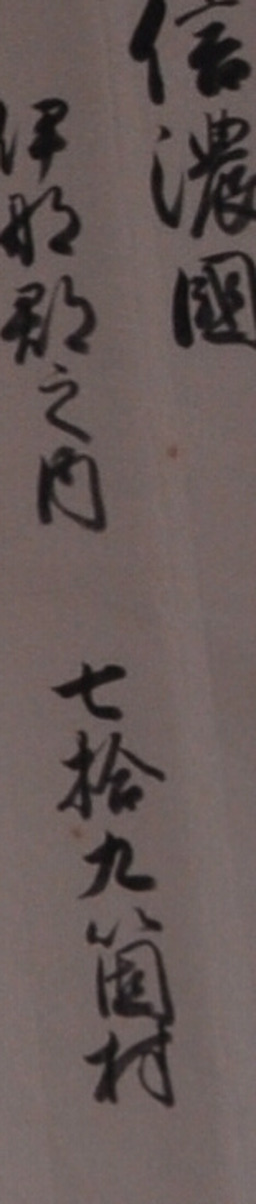伊那郡之内七十九箇村
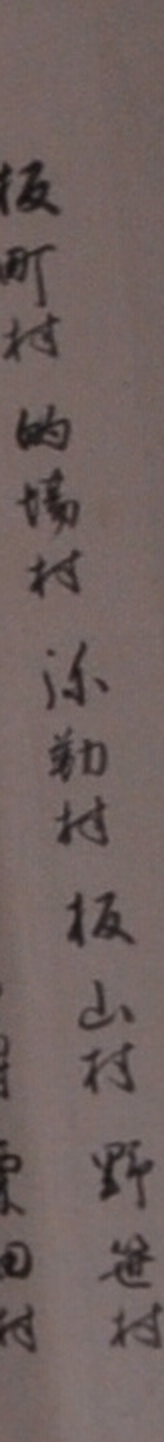板町村的場村弥勒村板山村野笹村
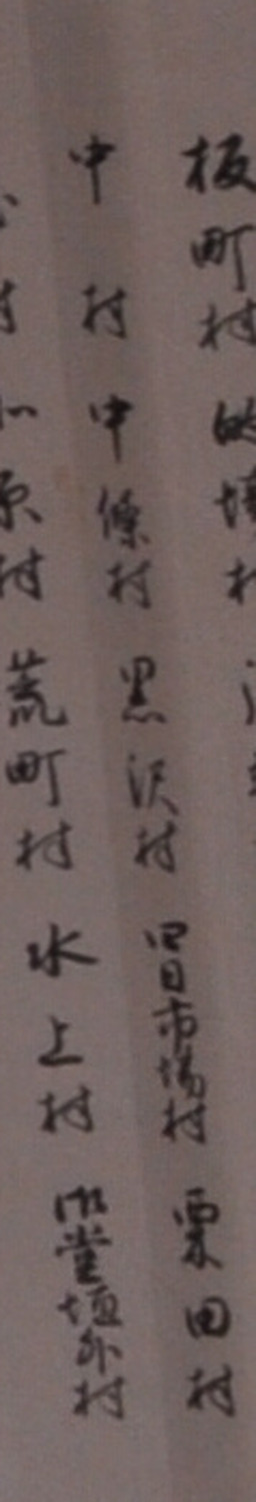台村小原村荒町村水上村御堂垣外村
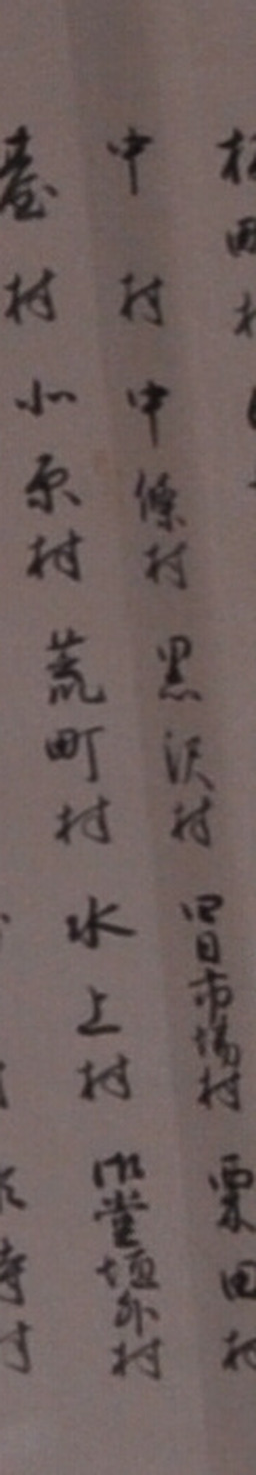台村小原村荒町村水上村御堂垣外村
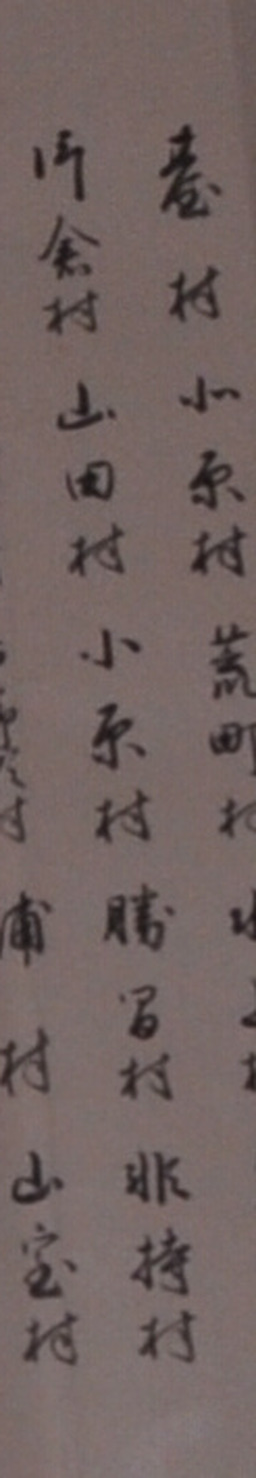片倉村山田村小原村勝間村非持村
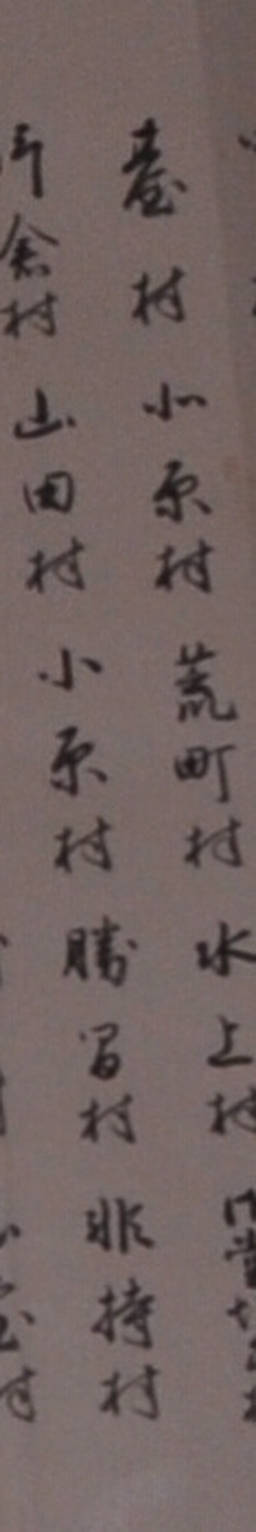片倉村山田村小原村勝間村非持村
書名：御朱印写・領地目録写
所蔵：伊那市立高遠町図書館・合同会社AMANE
